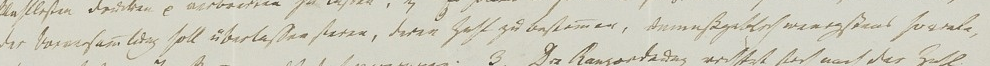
der Vorversammlung soll überlassen seien, deren Zahl zu bestimmen, unmaßgeblich wenigstens soviele,
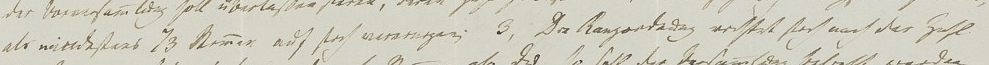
als mindestens 73 Stimmen auf sich vereinigen; 3, Die Rangordnung richtet sich nach der Zahl
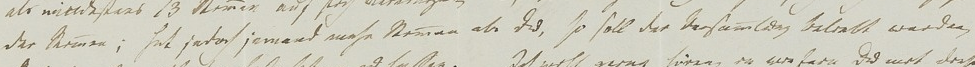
der Stimmen; hat jedoch jemand mehr Stimmen als Du, so soll der Versammlung beliebt werden,
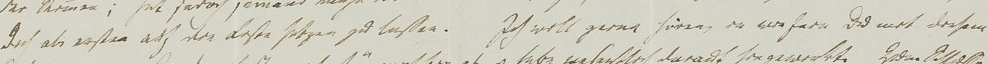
Dich als erstes auf die Liste setzen zu lassen. Ich will gerne hören, in wie fern Du mit diesem
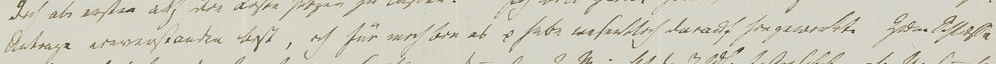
Antrage einverstanden bist, ich für mich bin es & habe wesentlich darauf hingewirkt. Zum Schlusse
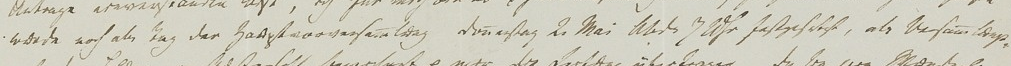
wurde noch als Tag der Hauptvorversammlung Donnerstag 2. Mai Abds 7 Uhr festgesetzt, als Versammlungs-
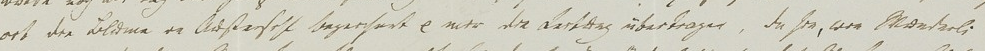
ort die Blume in Außersihl bezeichnet & mir die Leitung übertragen, da sie, wie Wunderli
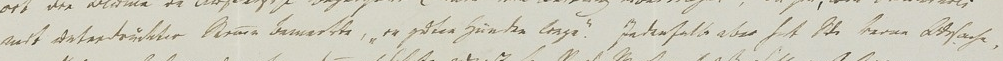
mit unterdrückter Stimme bemerkte, «in guten Händen liege». Jedenfalls aber hat W. keine Ursache,
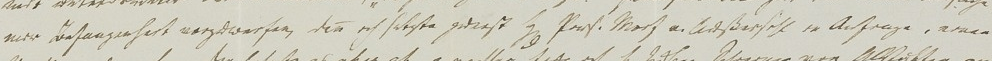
mir Befangenheit vorzuwerfen, denn ich setzte zuerst Herrn Präs. Morf a. Außersihl in Anfrage, einen
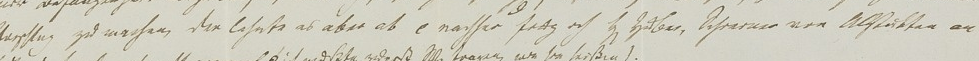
Vorschlag zu machen, der lehnte es aber ab & nachher frug ich Herrn Huber, Schreiner von Altstätten an
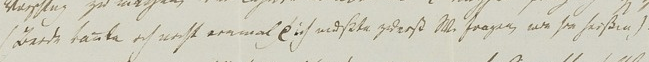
(Beide kannte ich nicht einmal & ich mußte zuerst W. fragen, wie sie heißen).
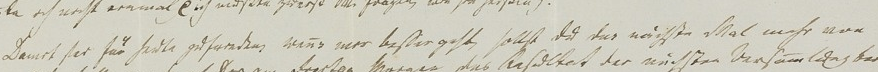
Damit sei für heute zufrieden, wenns mir besser geht, sollst Du das nächste Mal mehr von
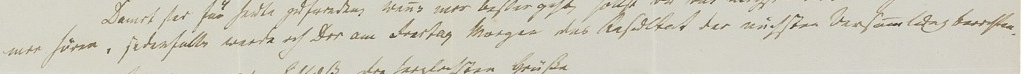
mir hören, jedenfalls werde ich Dir am Freitag Morgen das Resultat der nächsten Versammlung berichten.
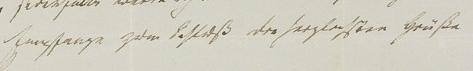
Empfange zum Schluß die herzlichsten Grüße
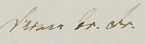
Deines tr. Fr.
